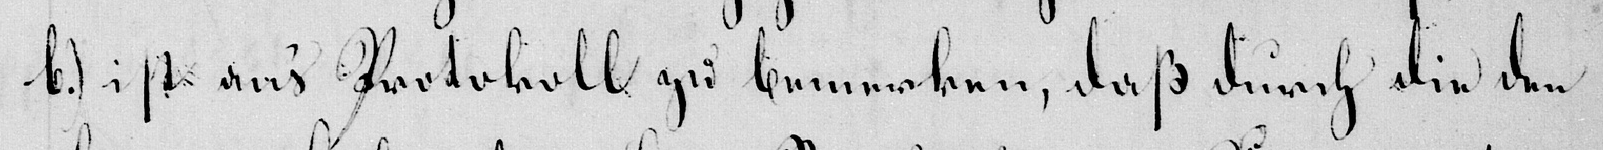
b.) ist an’s Protokoll zu bemerken, daß durch die den
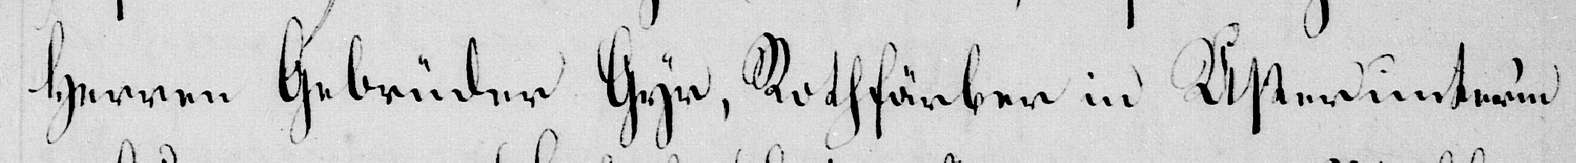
Herren Gebrüder Gyr, Rothfärber in Uster unterm
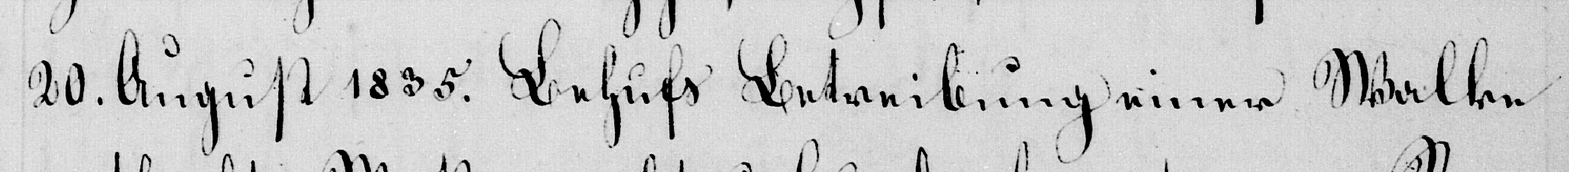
20. August 1835. Behufs Betreibung einer Walke
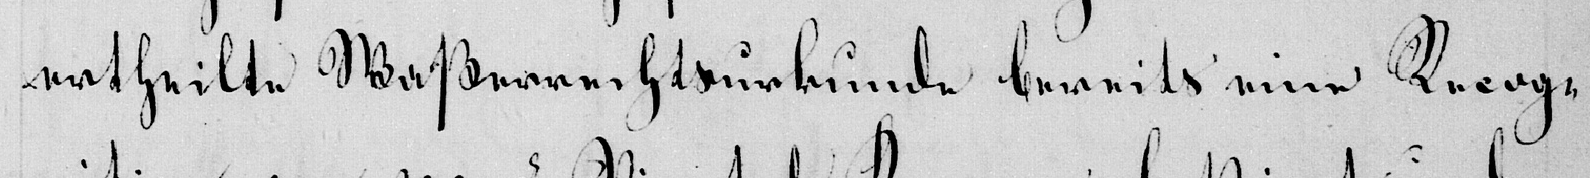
ertheilte Waßerrechtsurkunde bereits eine Recog¬
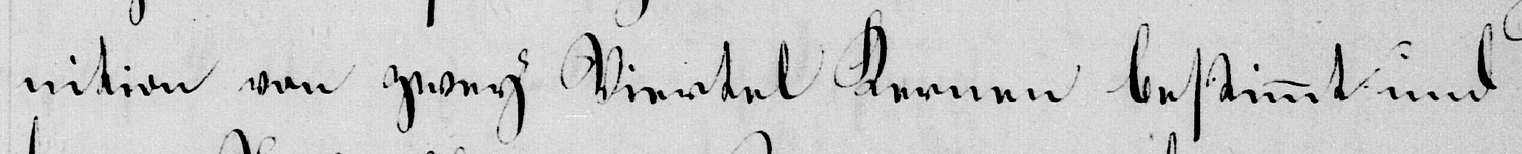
nition von zwey Viertel Kernen bestimmt und
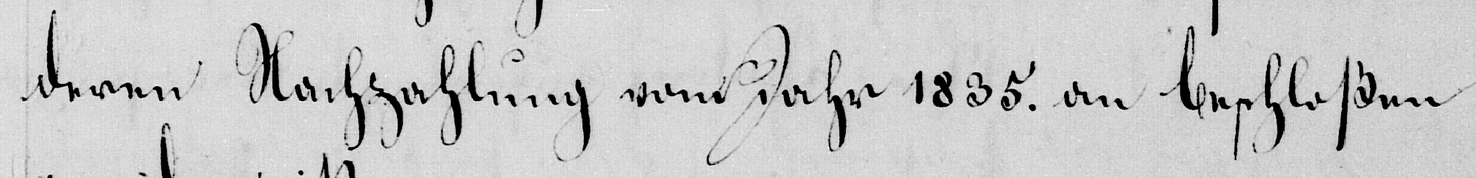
deren Nachzahlung vom Jahr 1835. an beschloßen
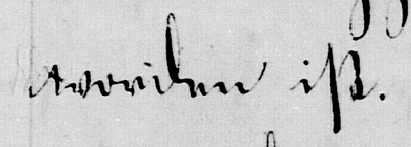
worden ist.
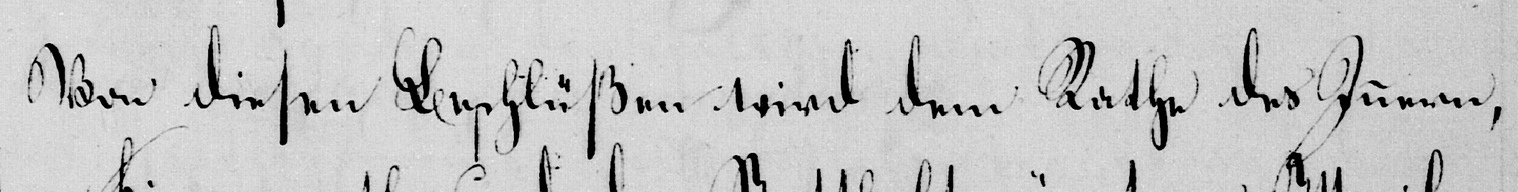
Von diesen Beschlüßen wird dem Rathe des Innern,
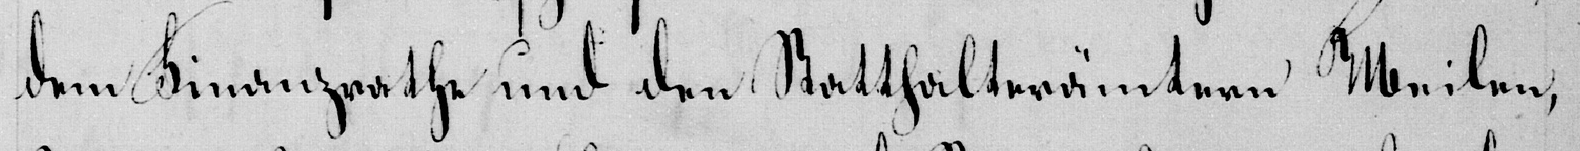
dem Finanzrathe und den Statthalterämtern Meilen,
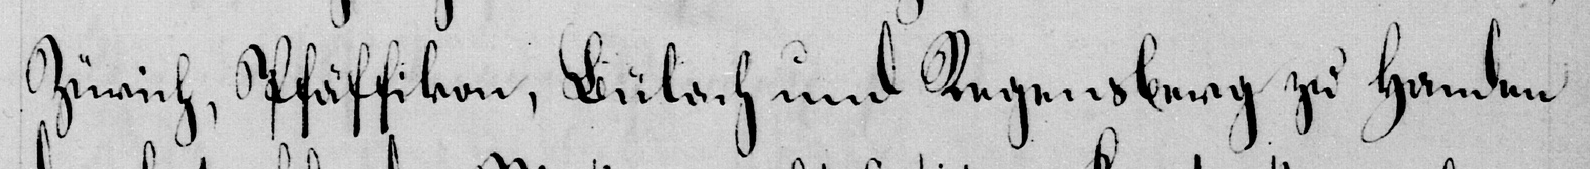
Zürich, Pfäffikon, Bülach und Regensberg zu Handen
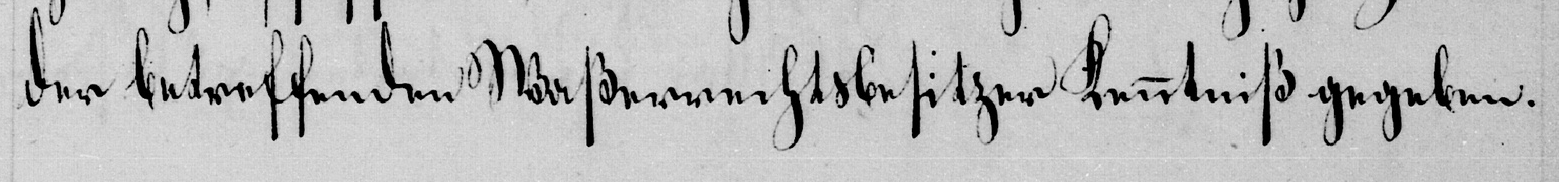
der betreffenden Waßerrechtsbesitzer Kenntniß gegeben.
